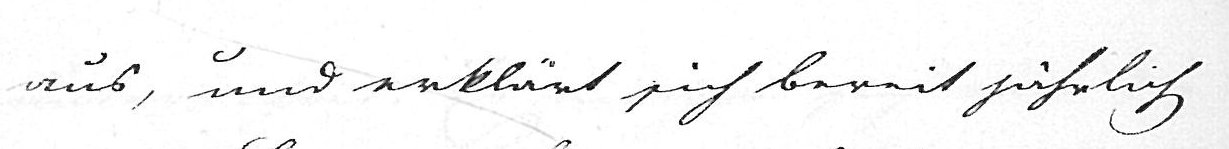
aus, und erklärt sich bereit jährlich
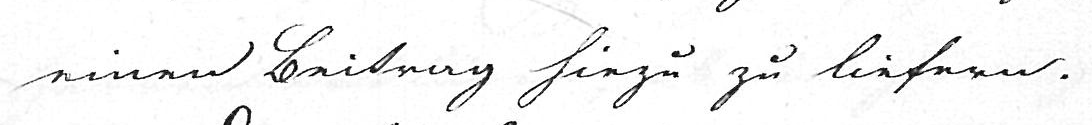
einen Beitrag hiezu zu liefern.
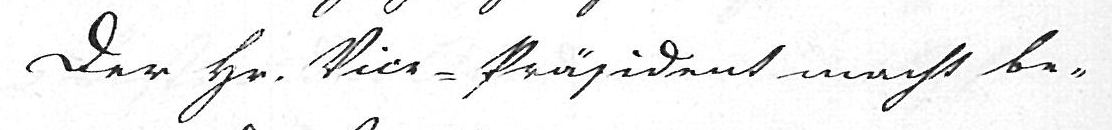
Der Hr. Vice-Präsident macht be-
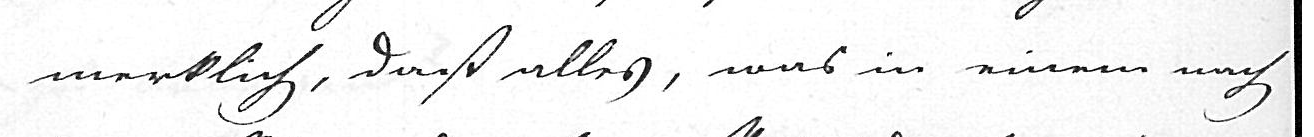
merklich, daß alles, was in einem nach
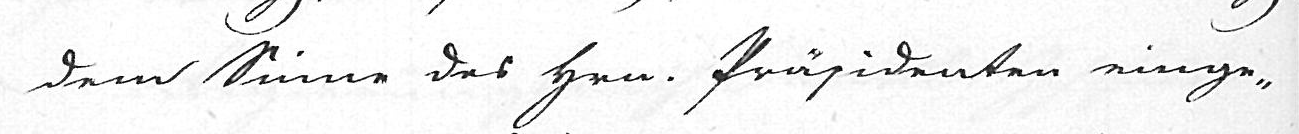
dem Sinne des Hrn. Präsidenten einge-
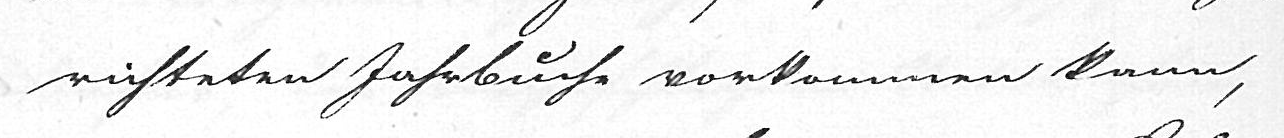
richteten Jahrbuche vorkommen kann,
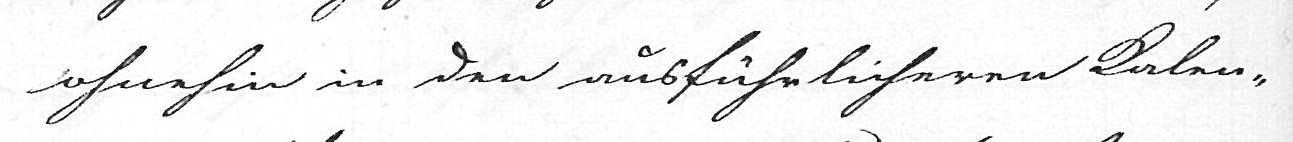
ohnehin in den ausführlicheren Kalen-
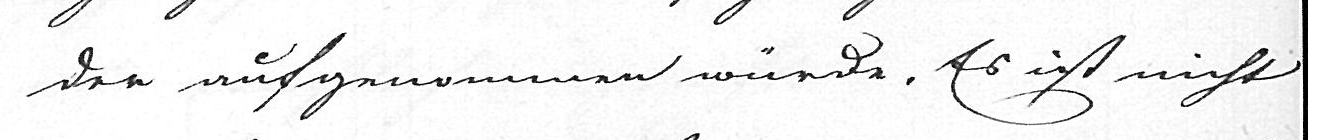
der aufgenommen würde. Es ist nicht
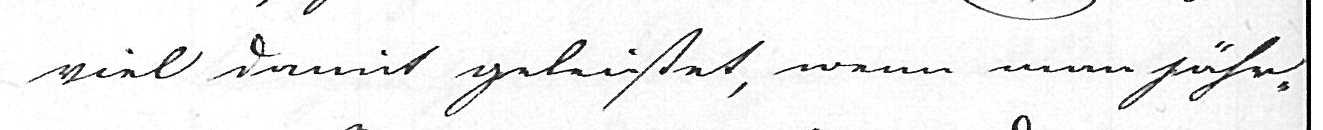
viel damit geleistet, wenn man jähr-
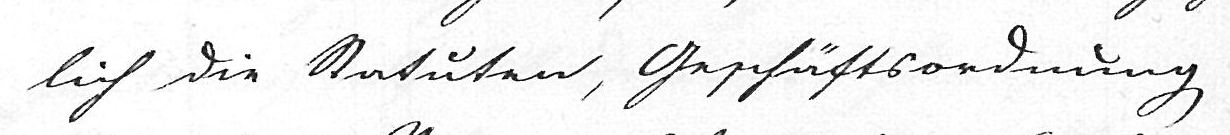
lich die Statuten, Geschäftsordnung
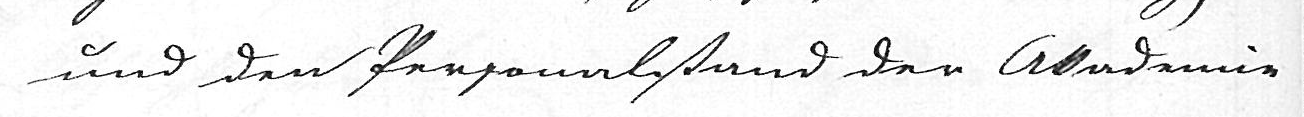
und den Personalstand der Akademie
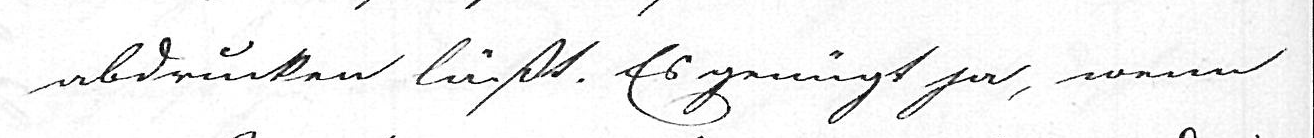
abdrucken läßt. Es genügt ja, wenn
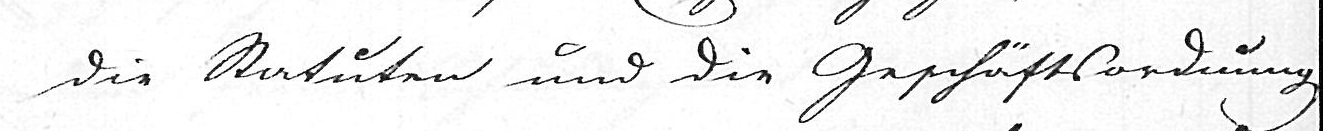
die Statuten und die Geschäftsordnung
